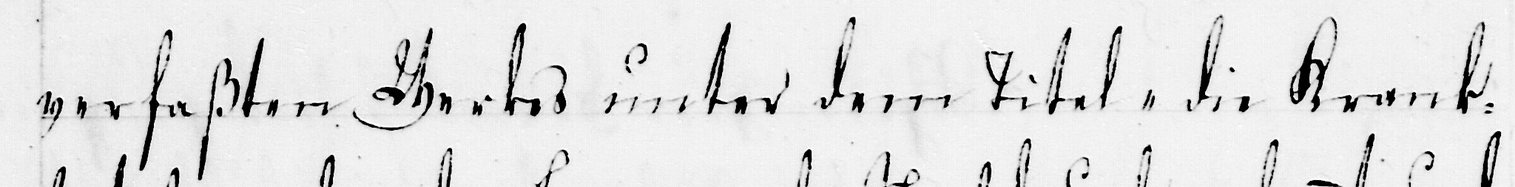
verfaßten Werkes unter dem Titel „die Krank¬
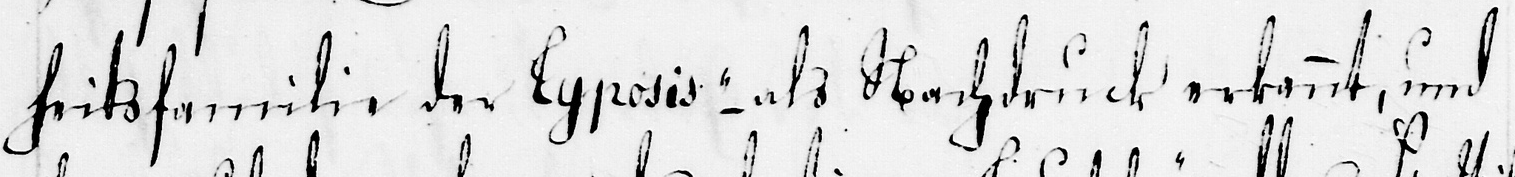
heitsfamilie der Typosis" – als Nachdruck erkannt, und
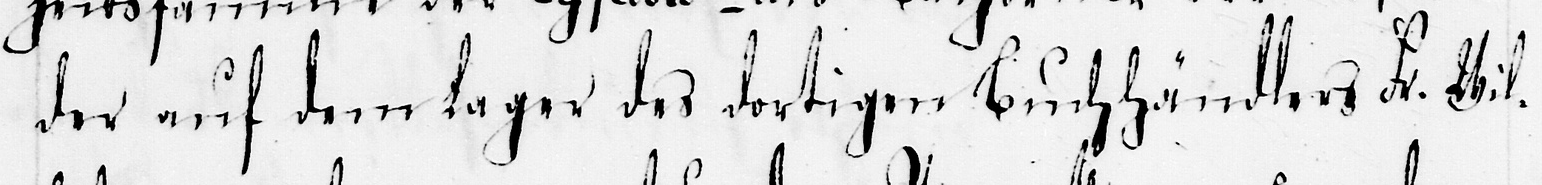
der auf dem Lager des dortigen Buchhändlers Fr. Wil¬
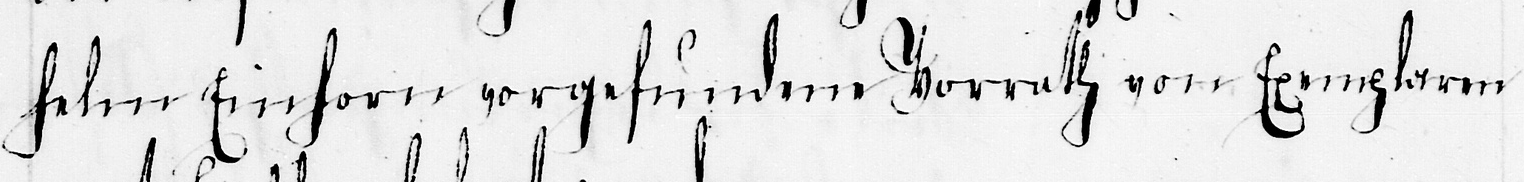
helm Einhorn vorgefundene Vorrath von Exemplaren
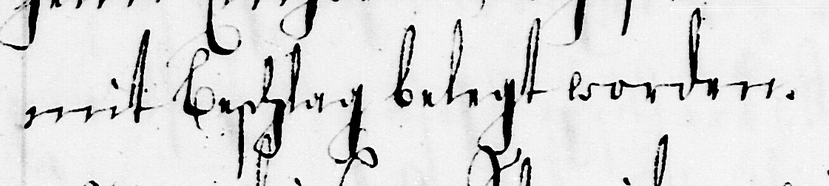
mit Beschlag belegt worden.
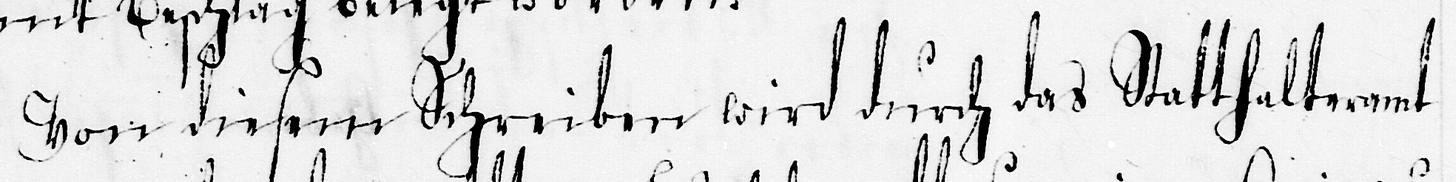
Von diesem Schreiben wird durch das Statthalteramt
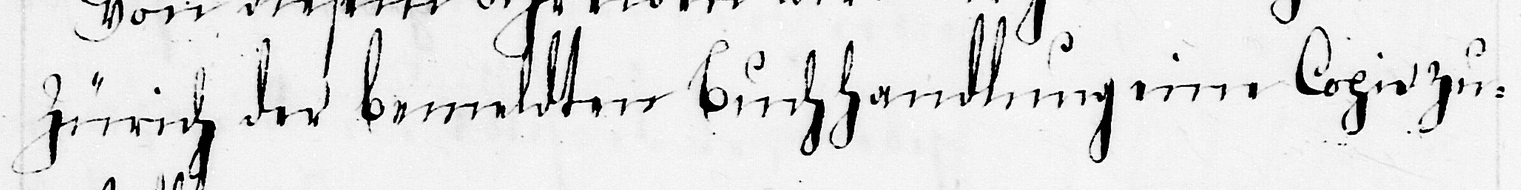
Zürich der bemeldten Buchhandlung eine Copie zu¬
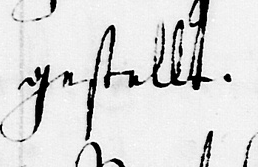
gestellt.
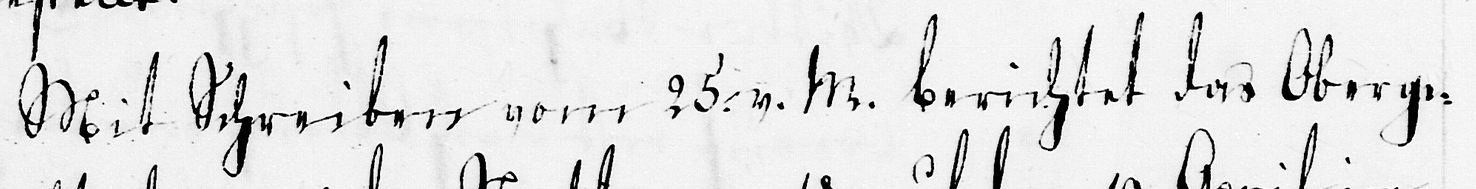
Mit Schreiben vom 25. v. M. berichtet das Oberge¬
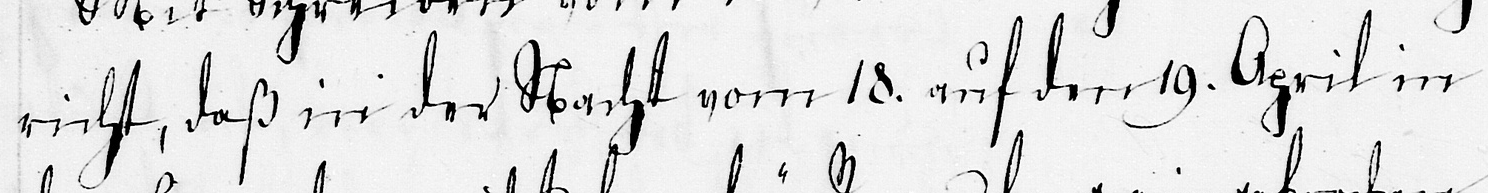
richt, daß in der Nacht vom 18. auf den 19. April in
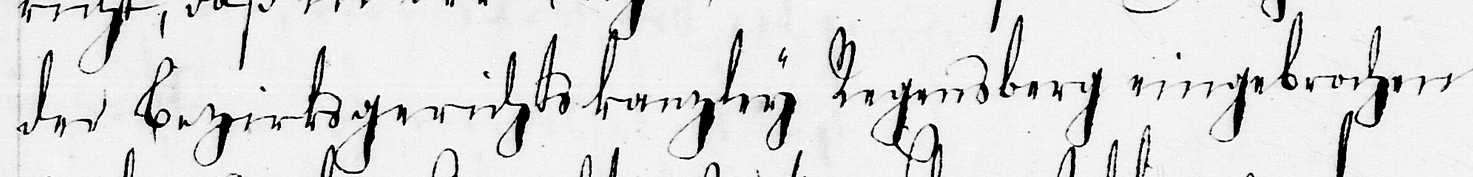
der Bezirksgerichtskanzley Regensberg eingebrochen
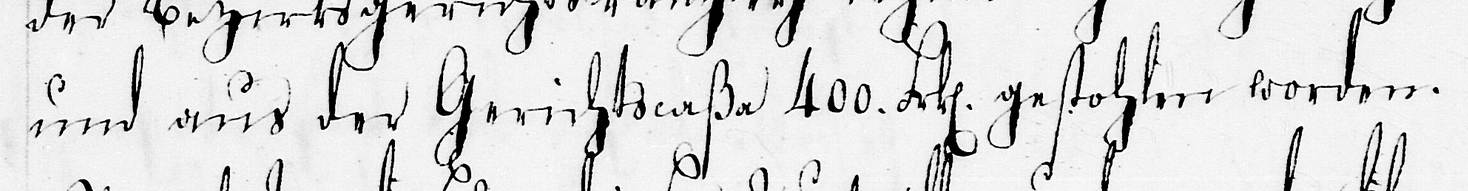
und aus der Gerichtscaßa 400. Frk[en]. gestohlen worden.
